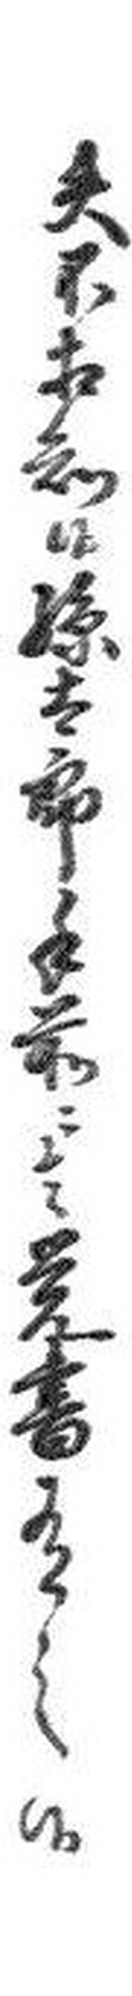失不相知候孫太郎手前ニ者覚書有之候
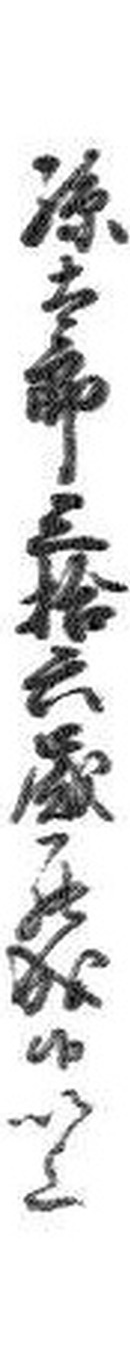孫太郎三拾六歳罷成候以上
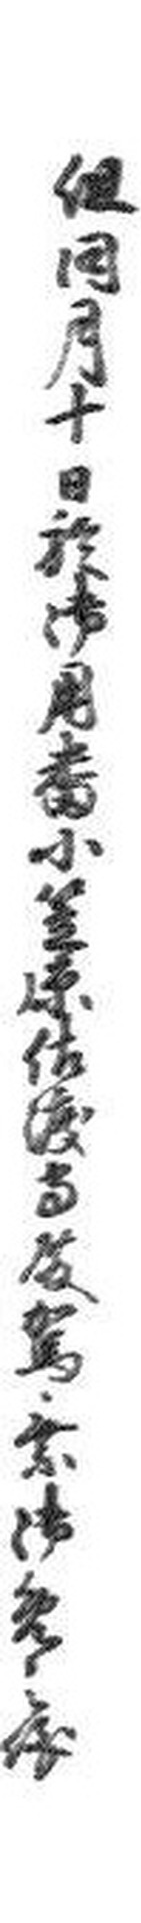但同月十日於御用番小笠原佐渡守殿駕乗御免之儀

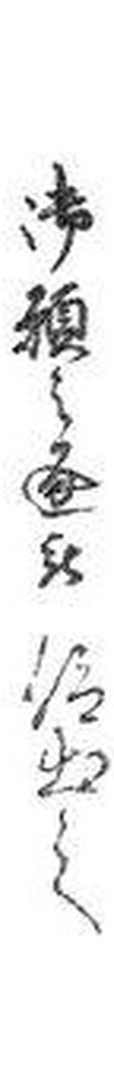御願之通被仰出之
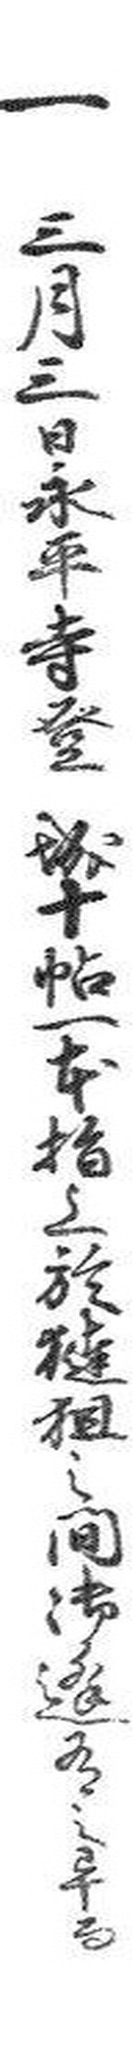一三月三日永平寺登城十帖一本指上於撻担之間御逢有之畢而
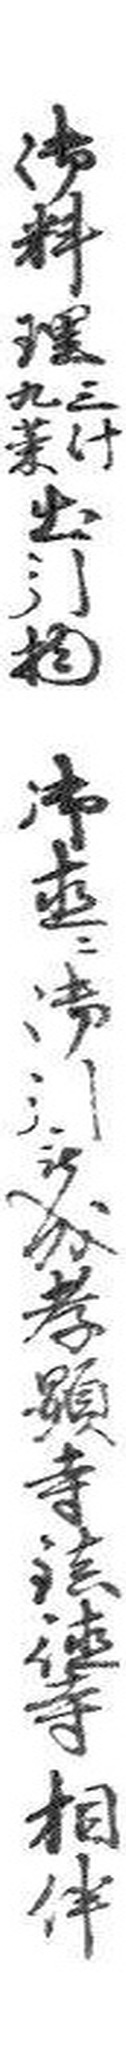九菜出引物御直ニ御引被成孝顕寺鎮徳寺相伴
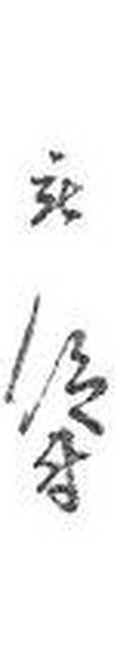被仰付
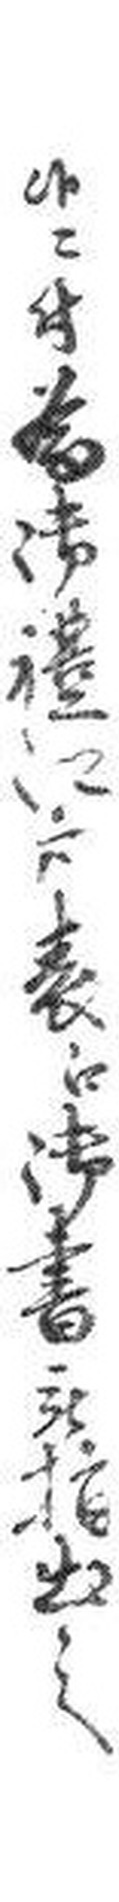候ニ付為御礼江戸表江御書被指出之
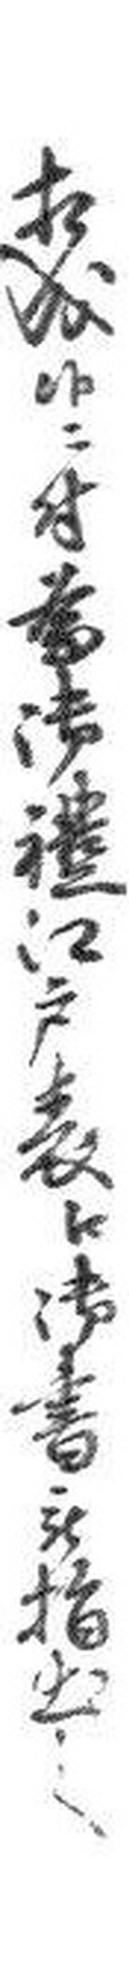相成候ニ付為御礼江戸表江御書被指出之
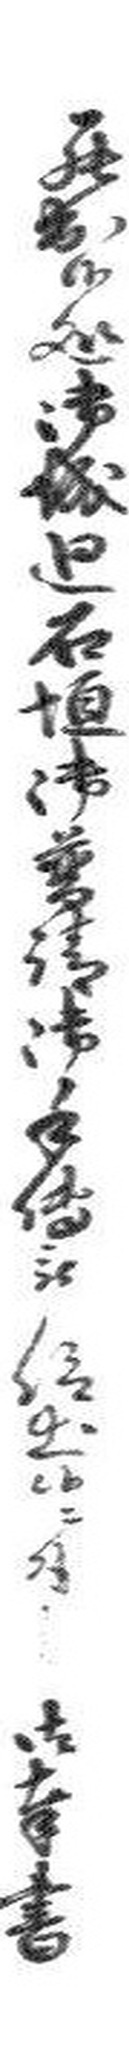罷出候処御城廻石垣御普請御手伝被仰出候ニ付御奉書
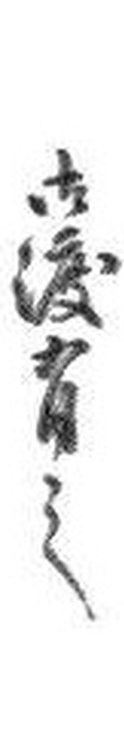御渡有之
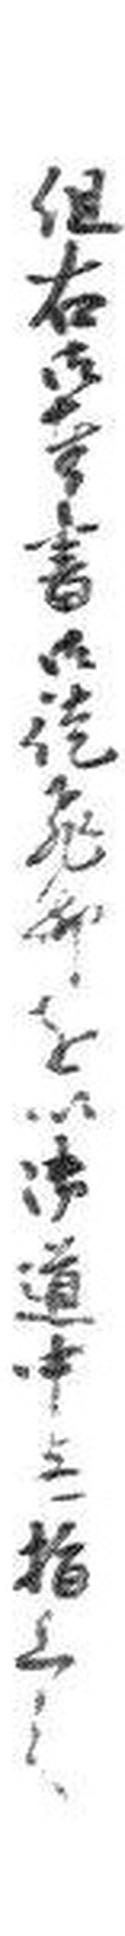但右御奉書御徒飛脚を以御道中迄指上之
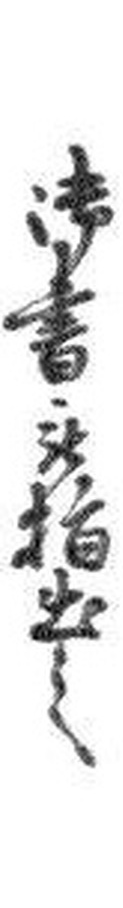御書被指出之
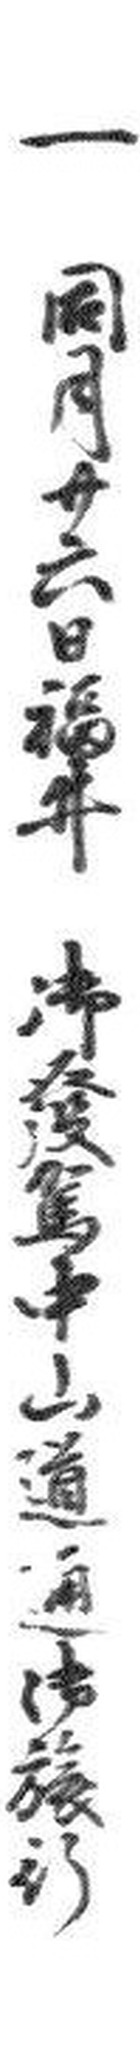一同月廿六日福井御発駕中山道通御旅行
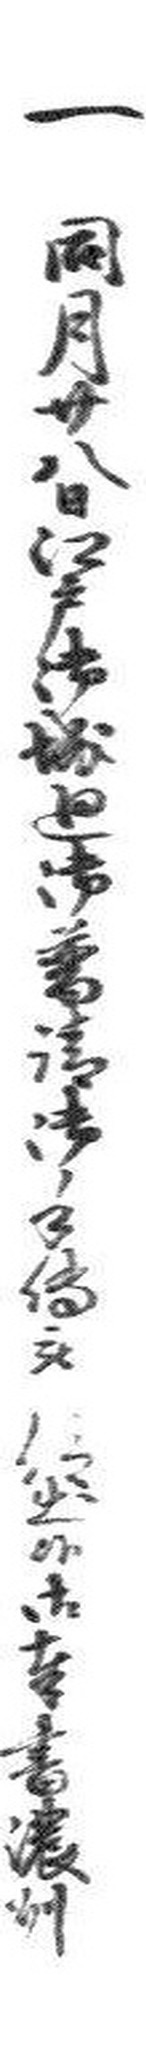一同月廿八日江戸御城廻御普請御手伝被仰出候御奉書濃州
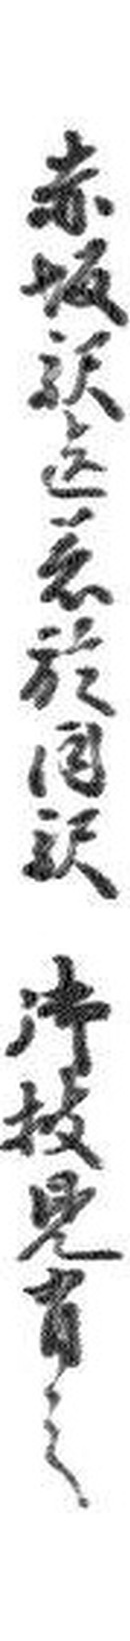赤坂駅迄着於同駅御被見有之
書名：家譜 二十三 吉品公 従宝永元年到同二年
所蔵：福井県文書館 Fukui Prefectural Archives
